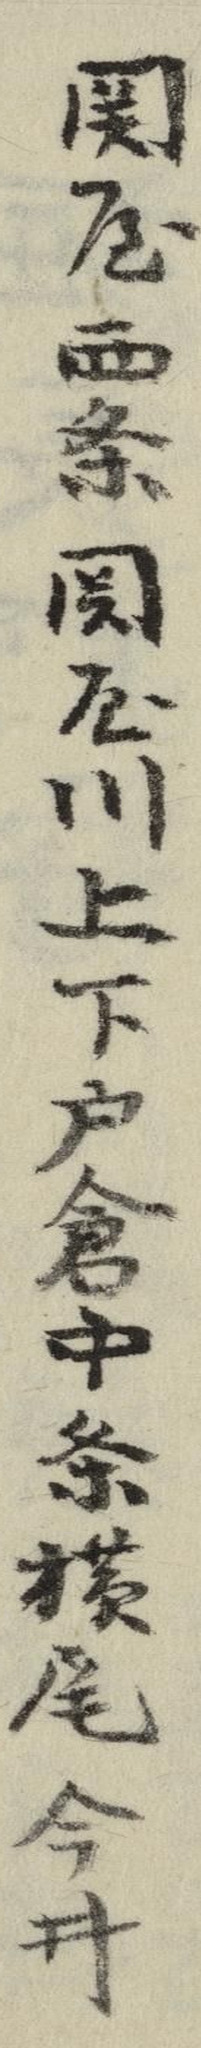関屋西条関屋川上下戸倉中条横尾今井
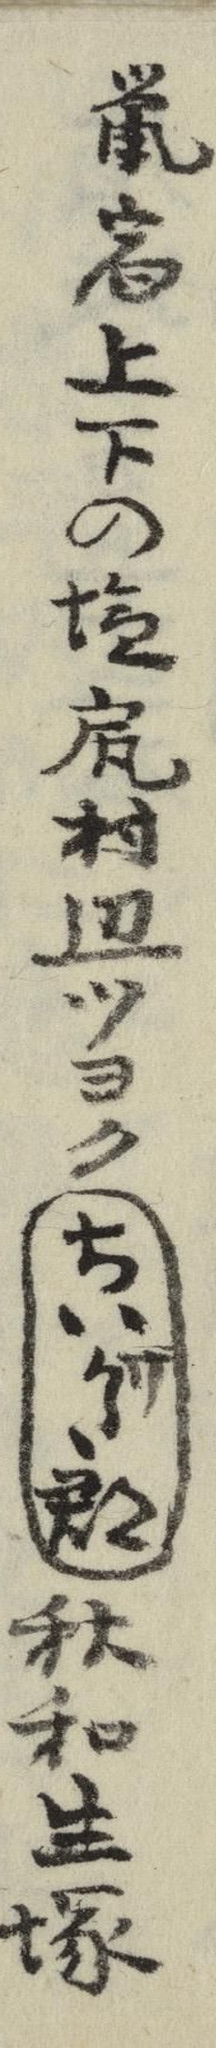鼠宿上下の塩尻村辺ツヨクちいサかた郡秋和生塚
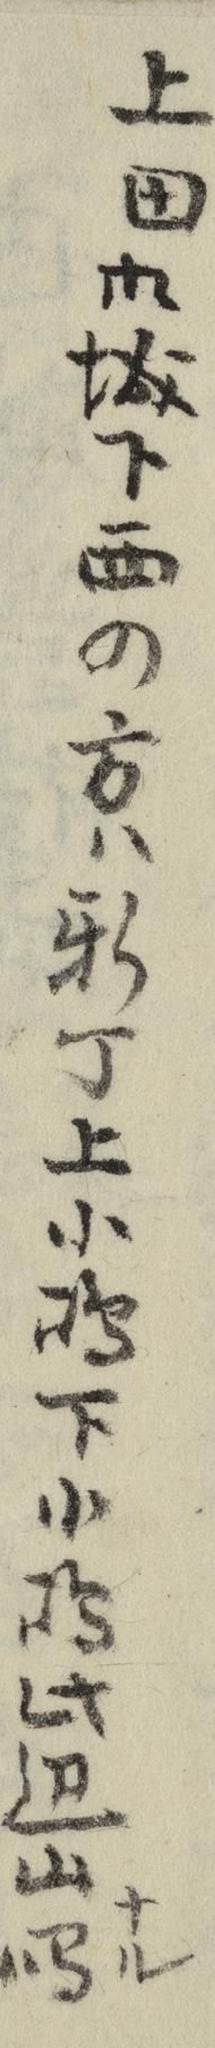上田御城下西の方ハ新丁上小嶋下小嶋此辺山鳴
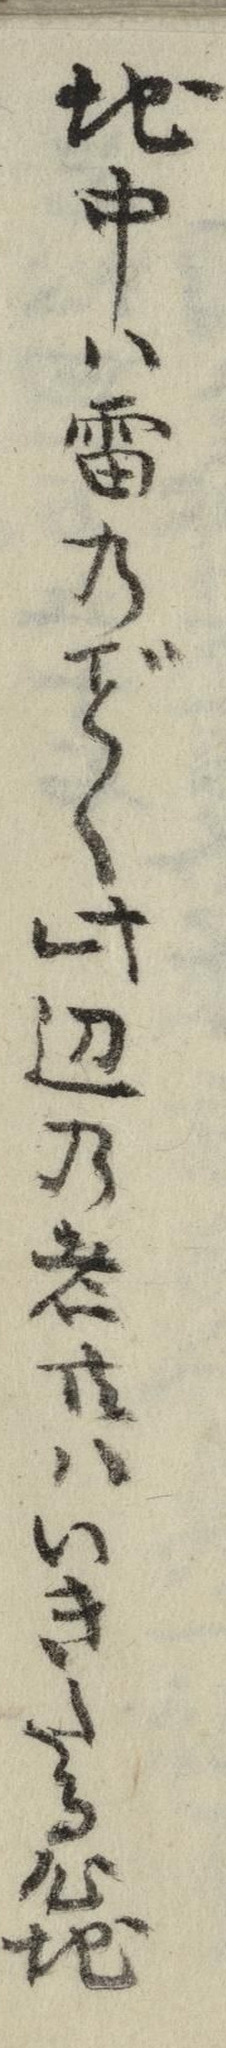地中ハ雷のごとく此辺の者共ハいきたる心地
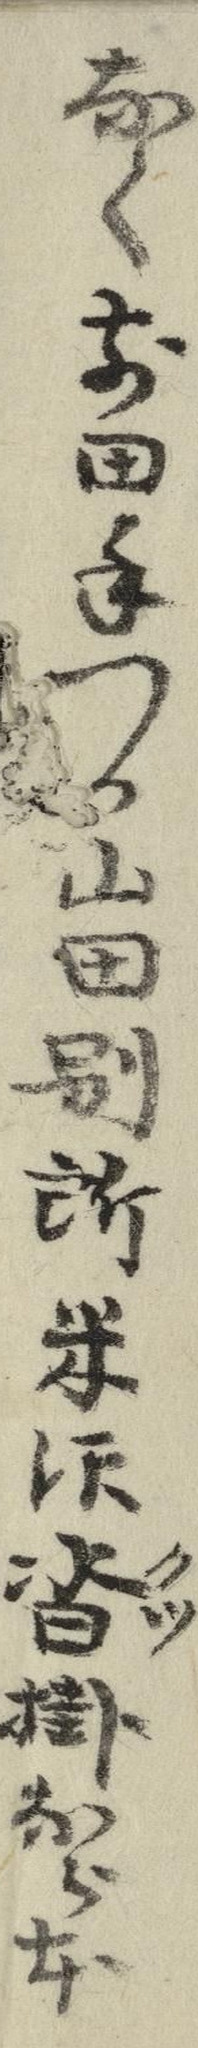なく前田手つか山田別所米沢沓掛なら本
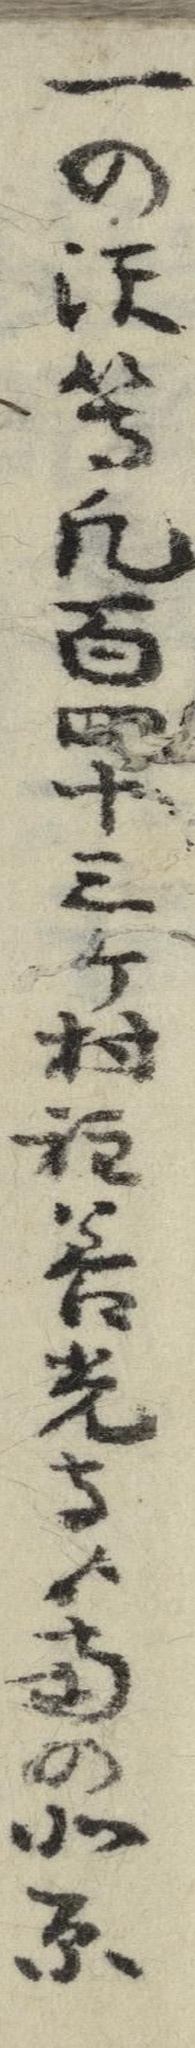一の沢等凡百四十三ヶ村程善光寺ゟ南の北原
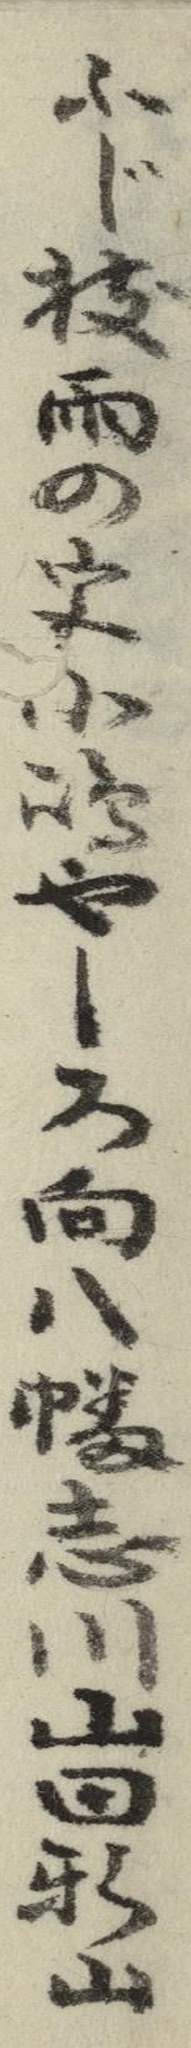ふじ枝雨の宮小嶋やしろ向八幡志川山田新山
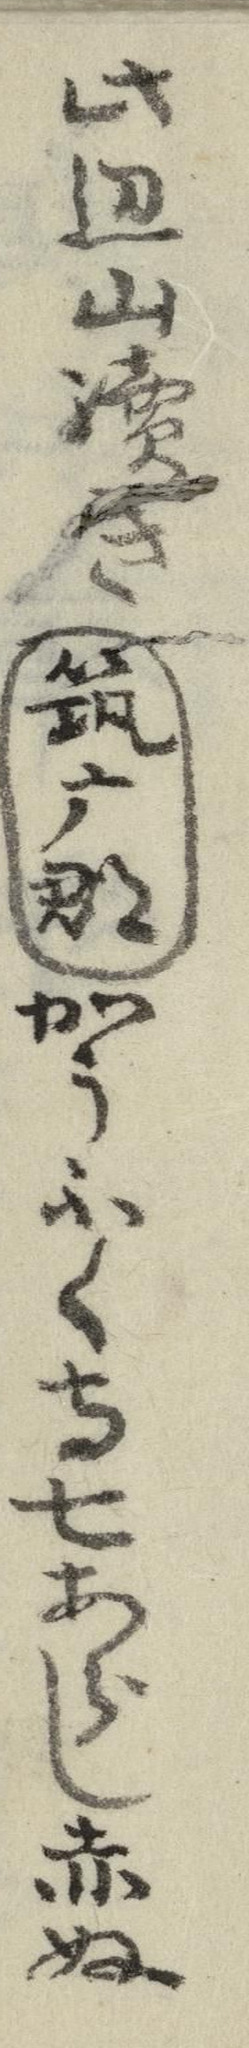此辺山続き筑摩郡かうふく寺七あらし赤ぬ
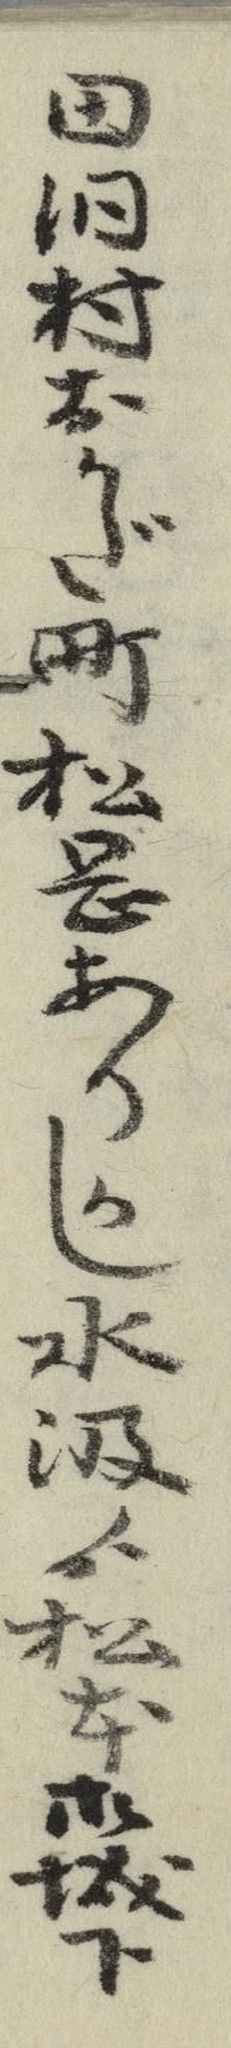田洞村おかだ町松岡ありかし水汲ゟ松本御城下
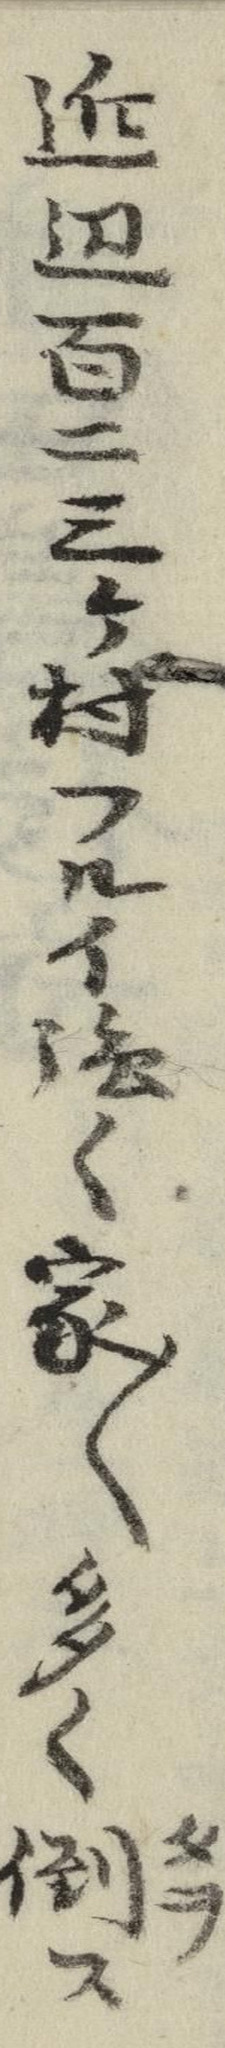近辺百二三ヶ村フルイ強く家〳〵多く倒ス
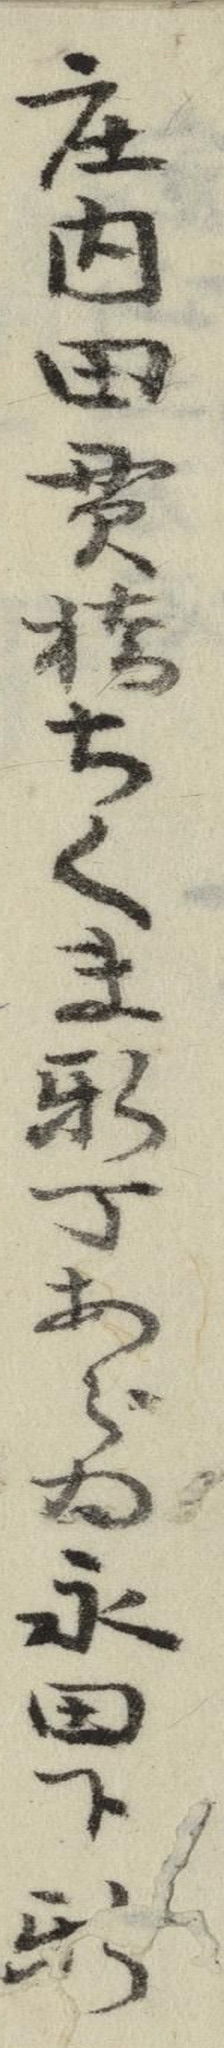庄内田貫橋ちくま新丁あらゐ永田下新
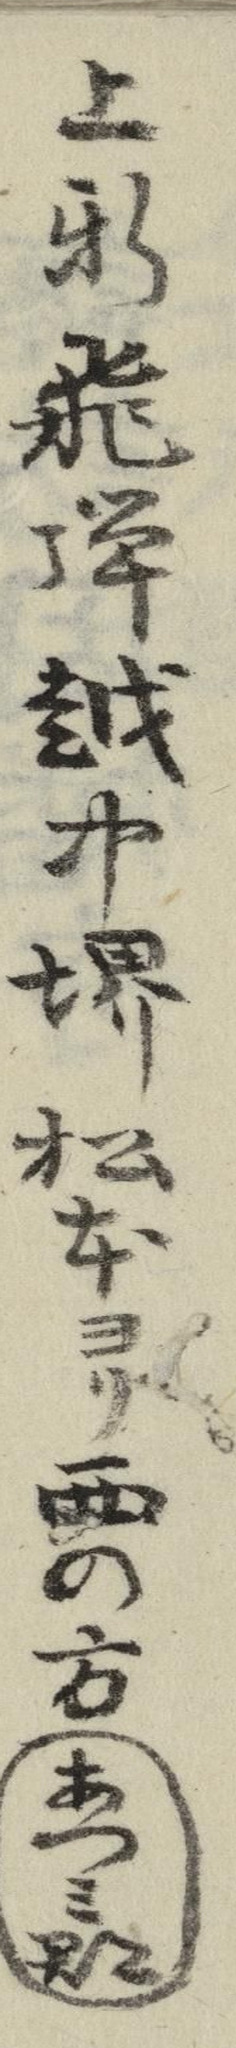上新飛彈越中堺松本ヨリ西の方あつみ郡
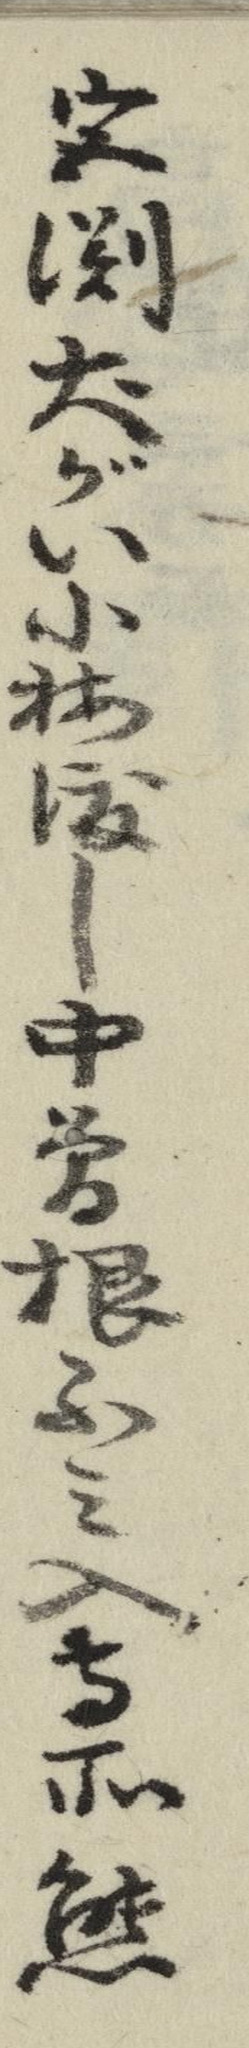宮渕犬がい小梅渡し中曽根ふみ入寺所熊
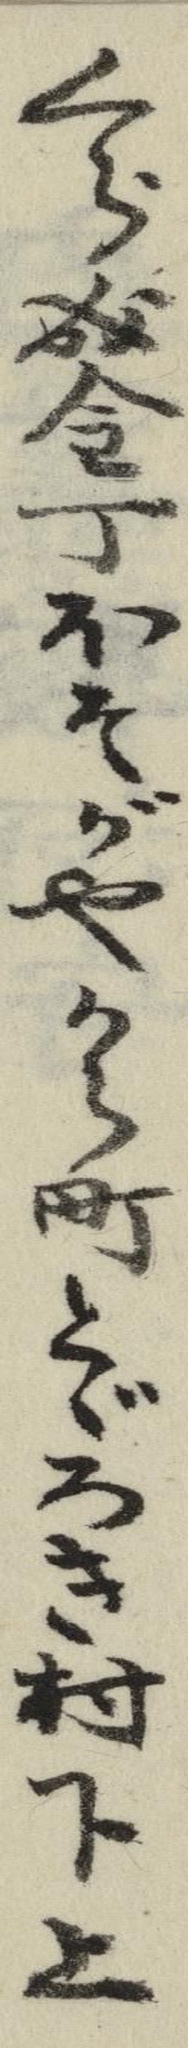くら成金丁ほそがやから町とヾろき村下上
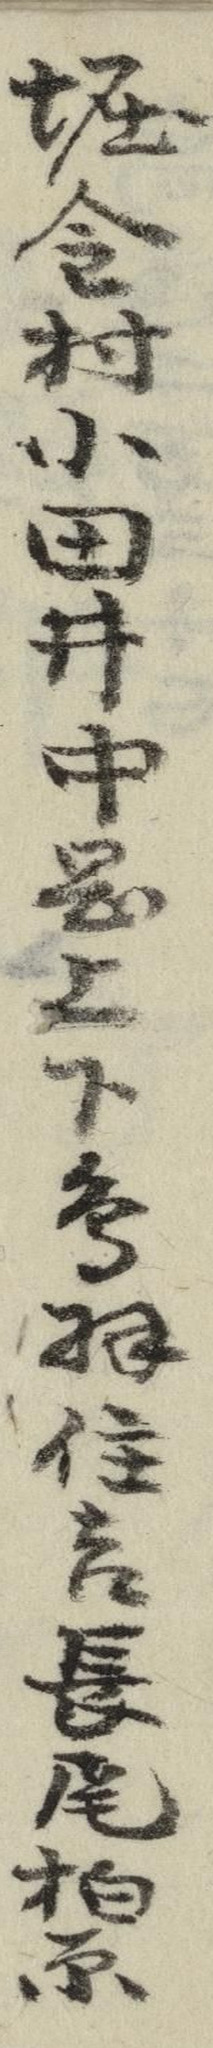堀金村小田井中岡上下鳥羽住吉長尾柏原
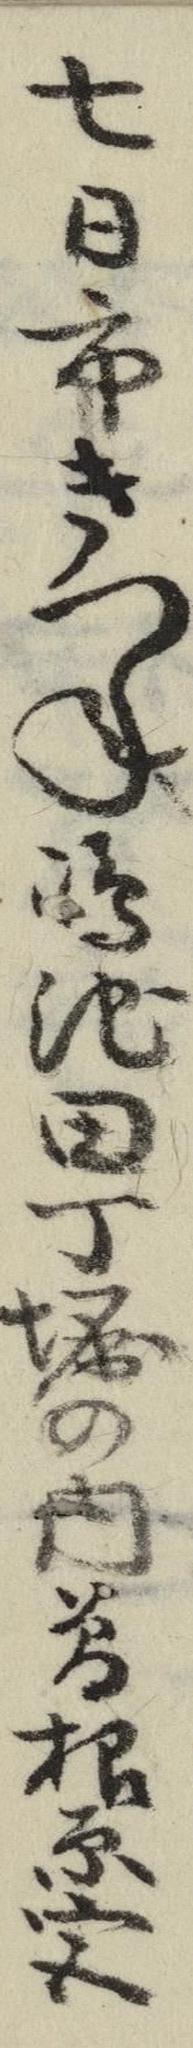七日市きつね嶋池田丁堀の内曽根原宮
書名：信州大地震一件之冩　丁未弘化四年三月吉日
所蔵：東京大学地震研究所図書室 Earthquake Research Institute Library, The University of Tokyo, JAPAN
